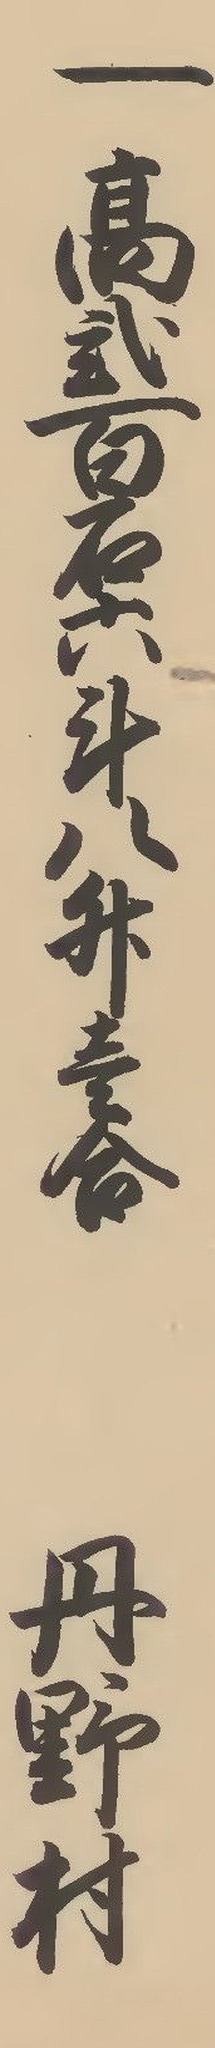一高弐百石六斗八升壱合丹野村
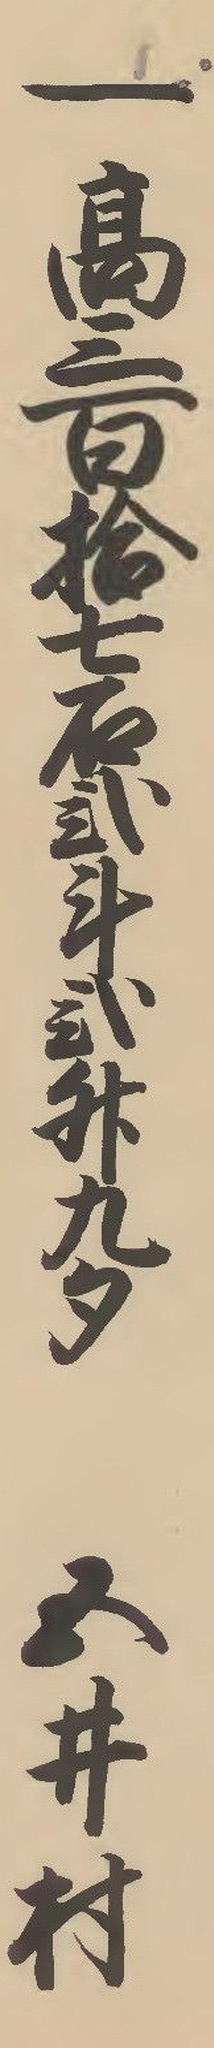一高三百拾七石弐斗弐升九勺五井村
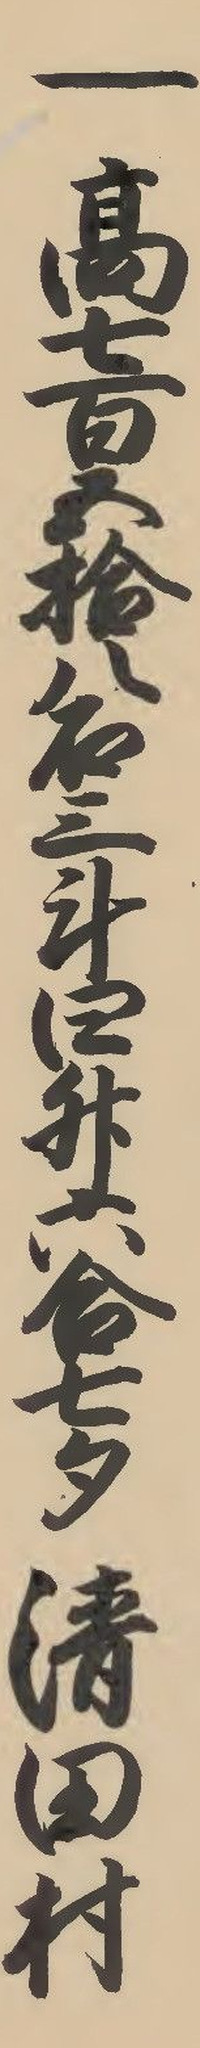一高七百五拾八石三斗四升六合七勺清田村
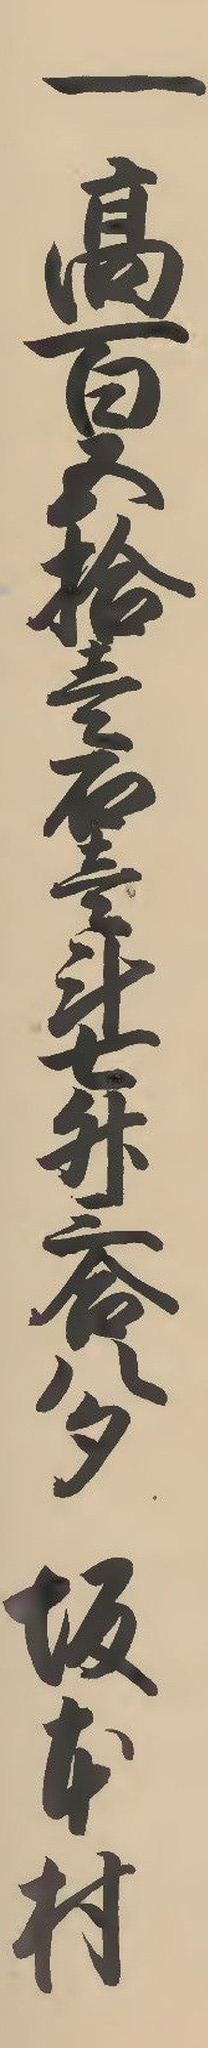一高百五拾壱石壱斗七升三合八勺坂本村
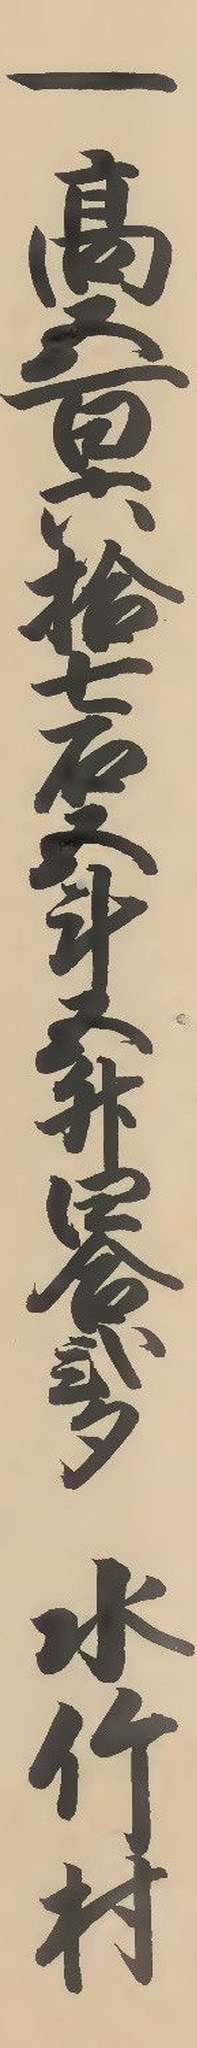一高五百六拾七石五斗五升四合弐勺水竹村
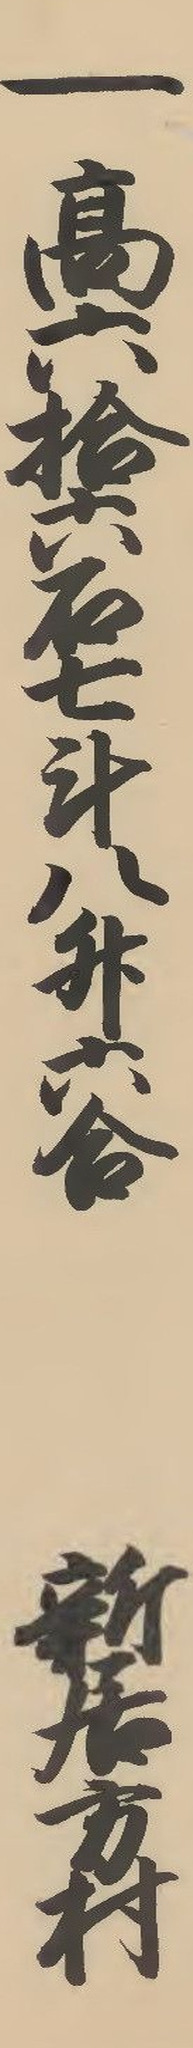一高六拾六石七斗八升六合新居方村
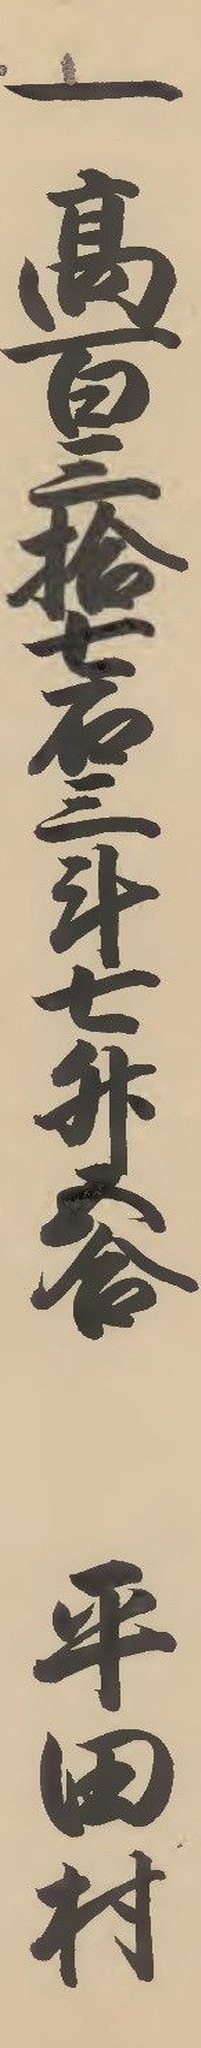一高百三拾七石三斗七升五合平田村
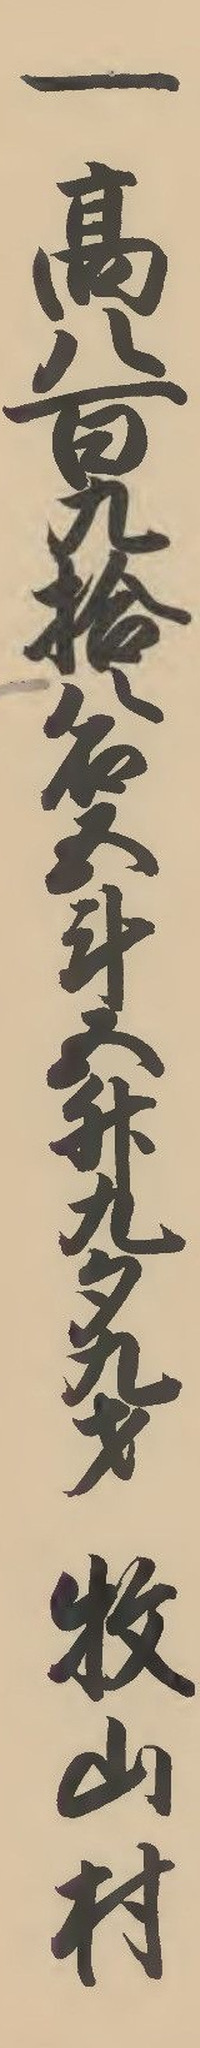一高八百九拾八石五斗五升九勺九才牧山村

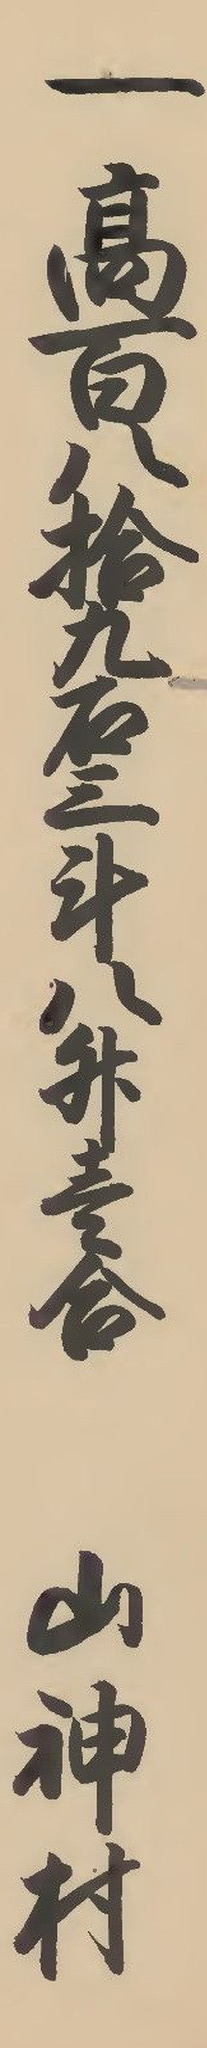一高百八拾九石三斗八升壱合山神村
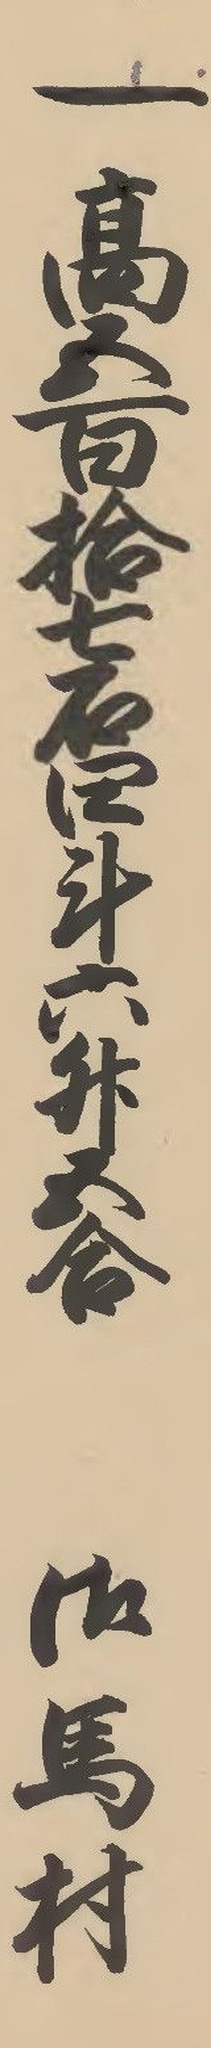一高五百拾七石四斗六升五合御馬村
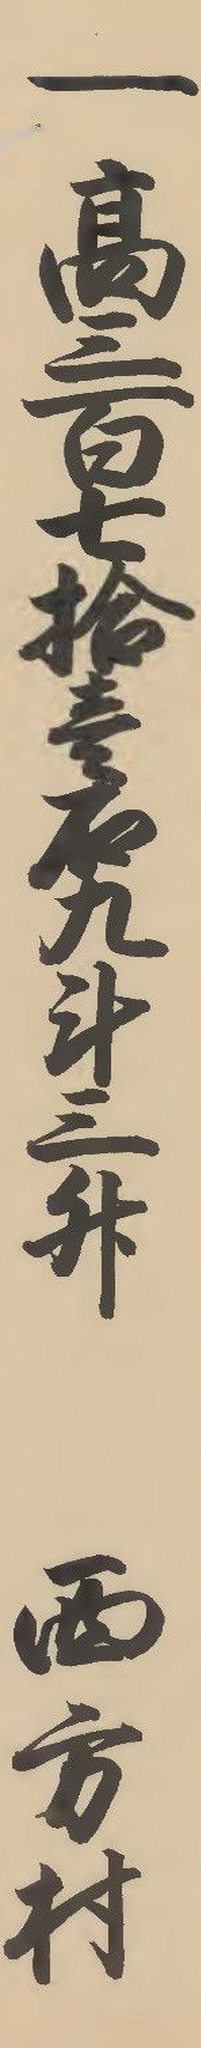一高三百七拾壱石九斗三升西方村
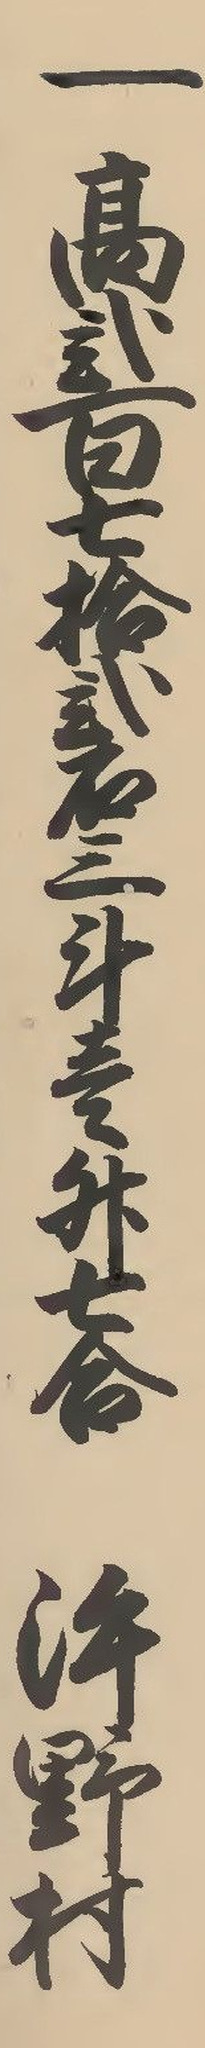一高弐百七拾弐石三斗壱升七合泙野村
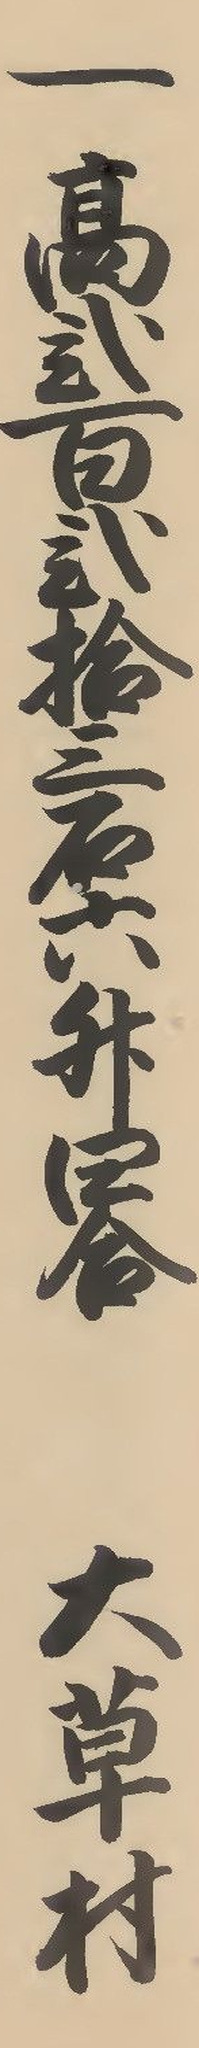一高弐百弐拾三石六升四合大草村
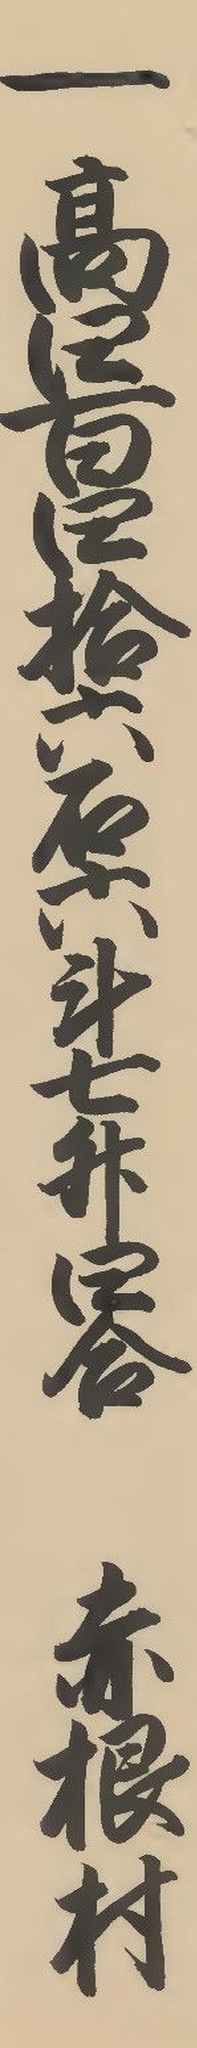一高四百四拾六石六斗七升四合赤根村
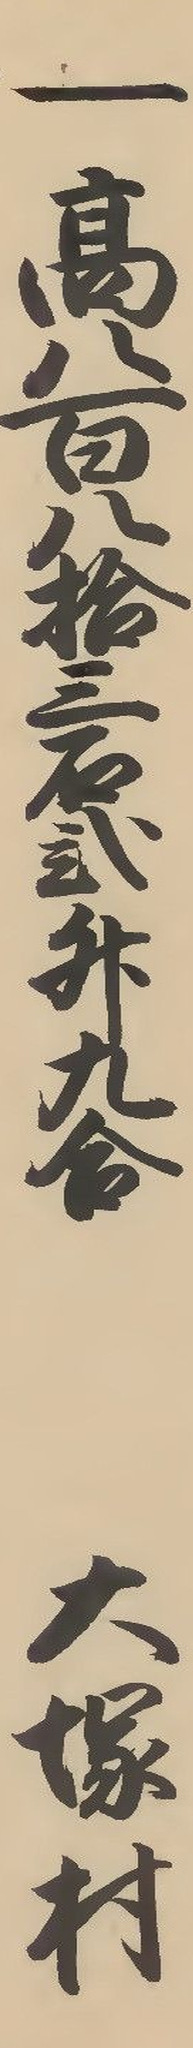一高八百八拾三石弐升九合大塚村
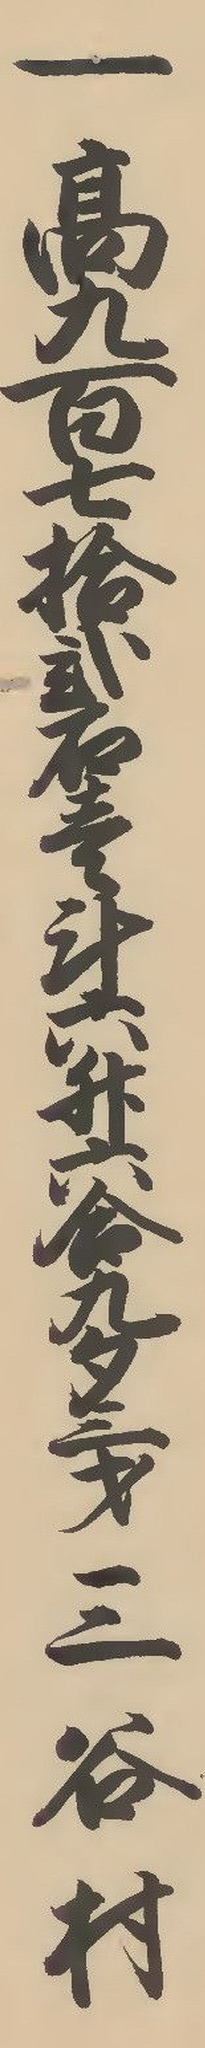一高九百七拾弐石壱斗六升六合九勺三才三谷村
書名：三河国郷帳
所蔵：国立公文書館 National Archives of Japan
